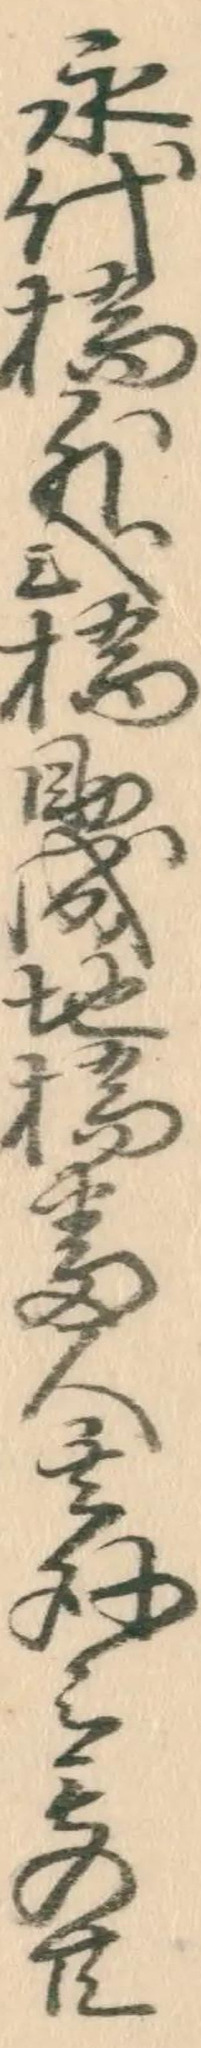永代橋外弐橋助成地橋番人其外之もの共
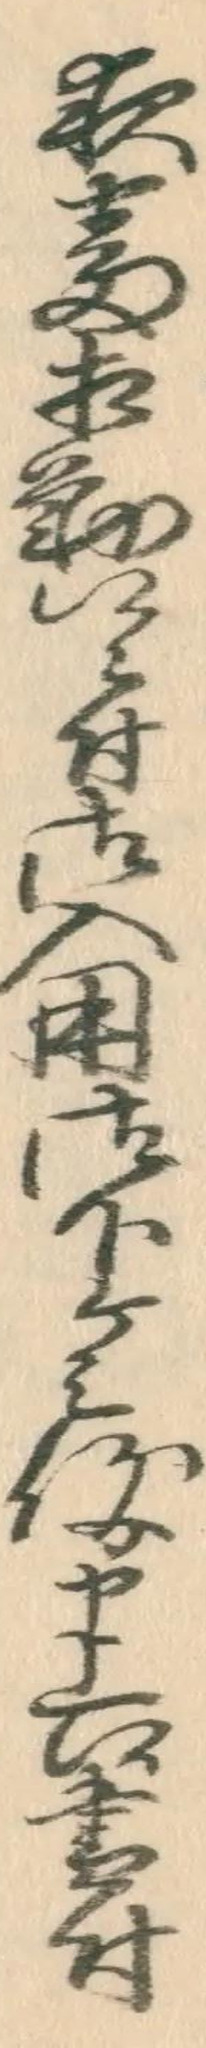夜番相勤候ニ付御入用御下ケ之儀申上候書付
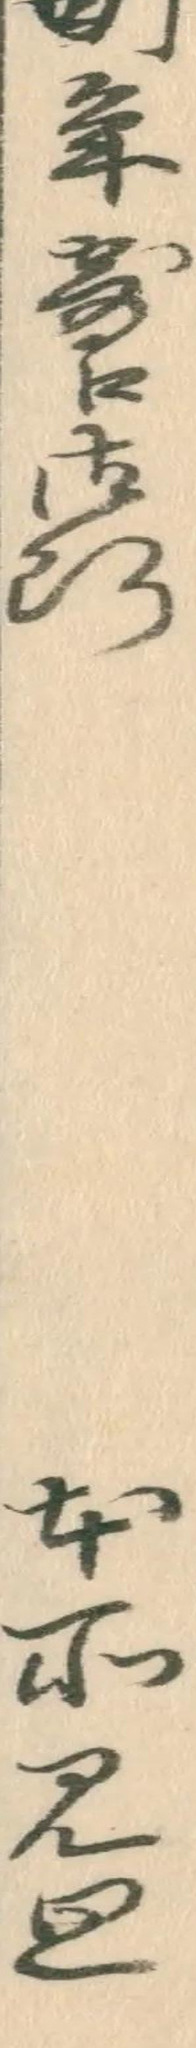町年寄え御断本所見廻り
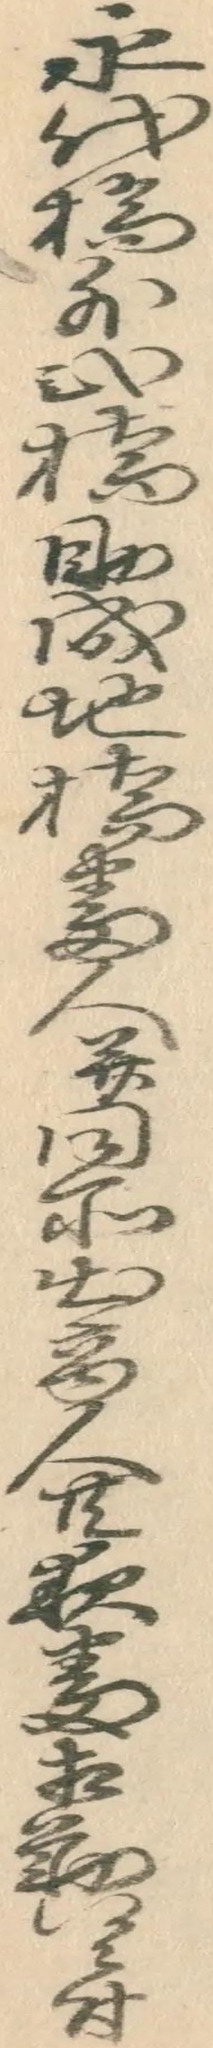永代橋外弐橋助成地橋番人并同所出商人共夜番相勤候ニ付
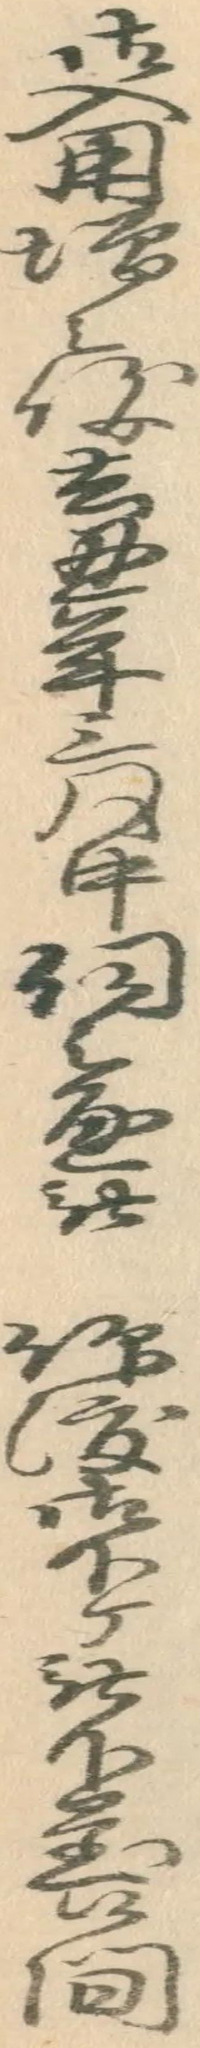御入用増之儀去丑年三月中伺之通被仰渡御下ケ被下置候間

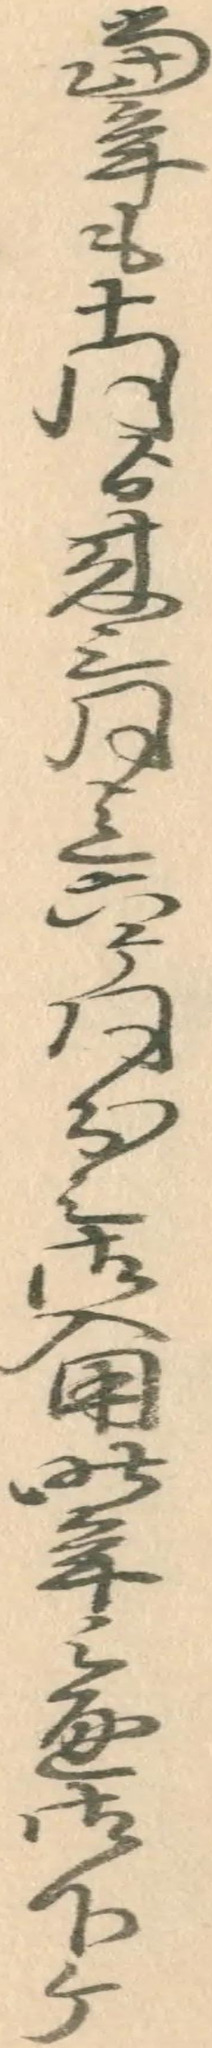当年も十月ゟ来三月迄六ケ月分之御入用昨年之通御下ケ
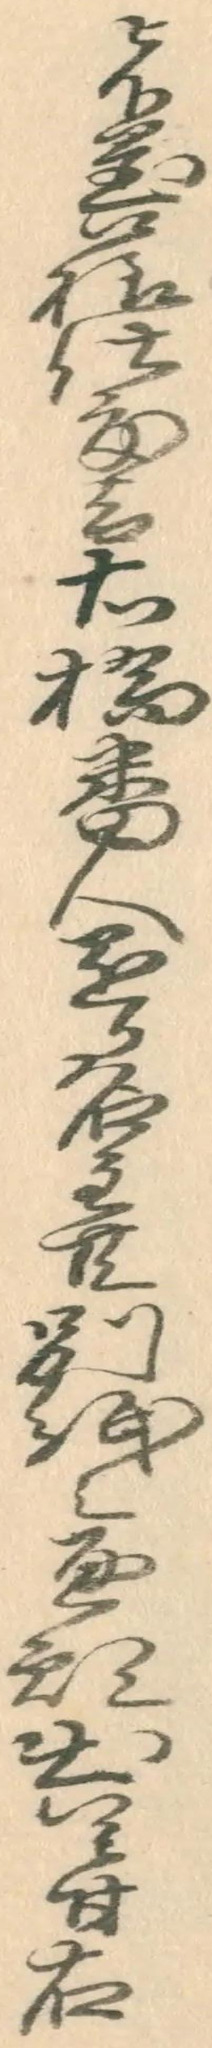被下置候様仕度旨右橋番人懸り名主共別紙之通願出候ニ付右
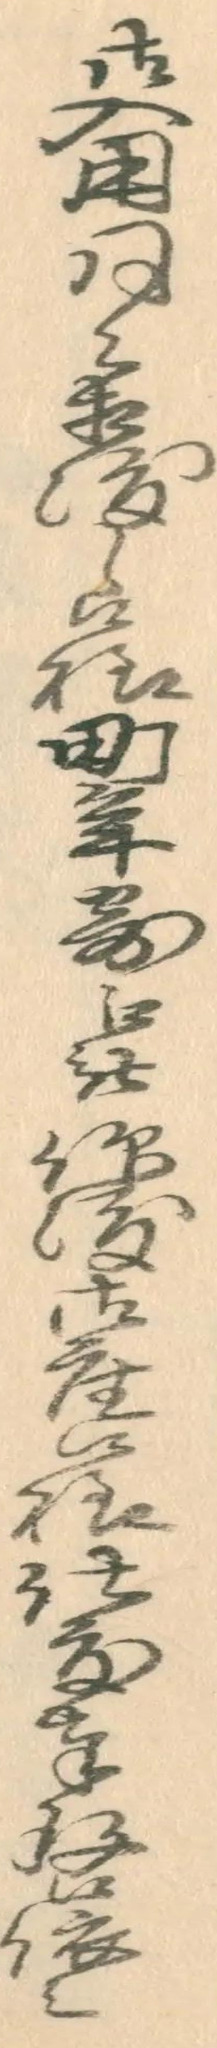御入用月々相渡し候様町年寄え被仰渡御座候様仕度奉存候依之
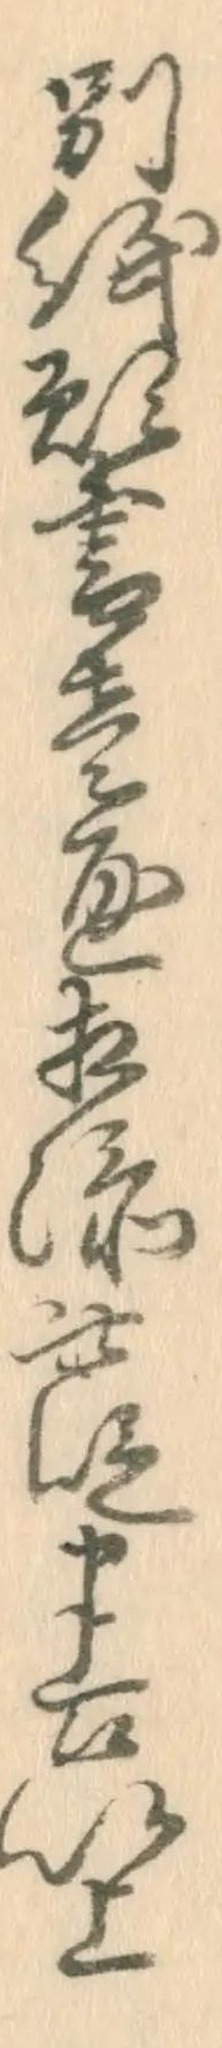別紙願書壱通相添此段申上候以上
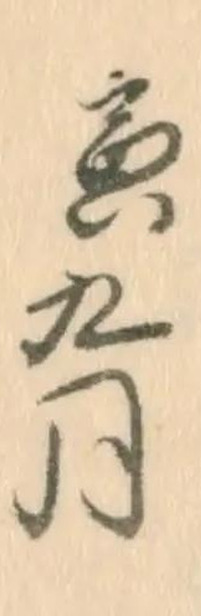寅九月
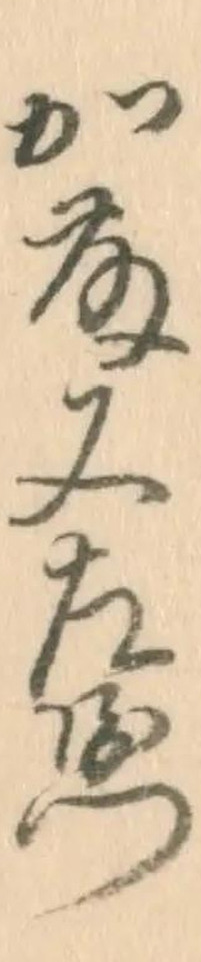加藤又左衛門
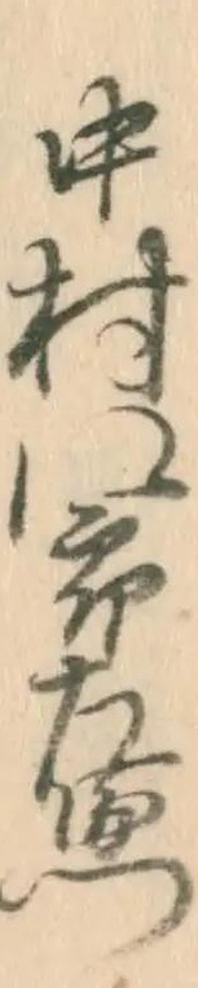中村八郎左衛門
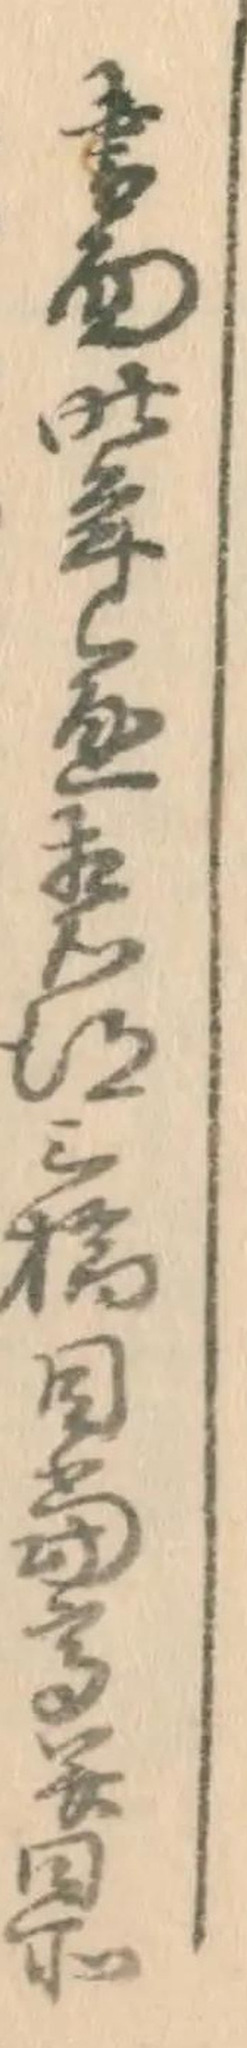書面昨年之通相心得三橋目当高并同所
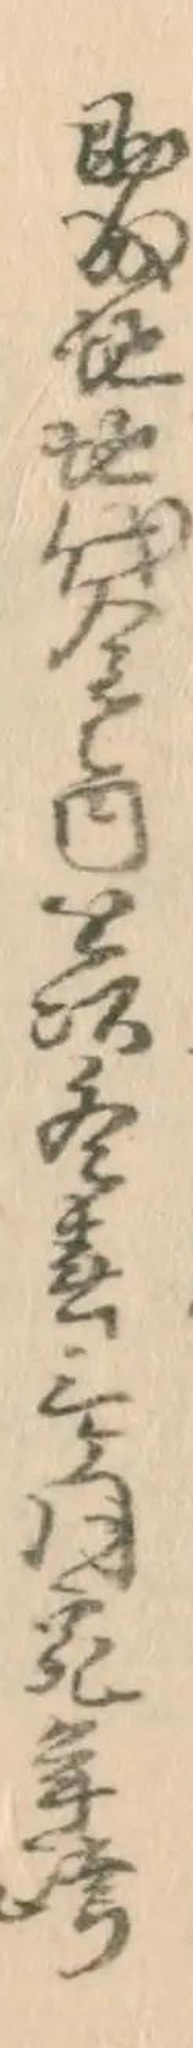助成地地代金之内を以冬春三ケ月宛年跨
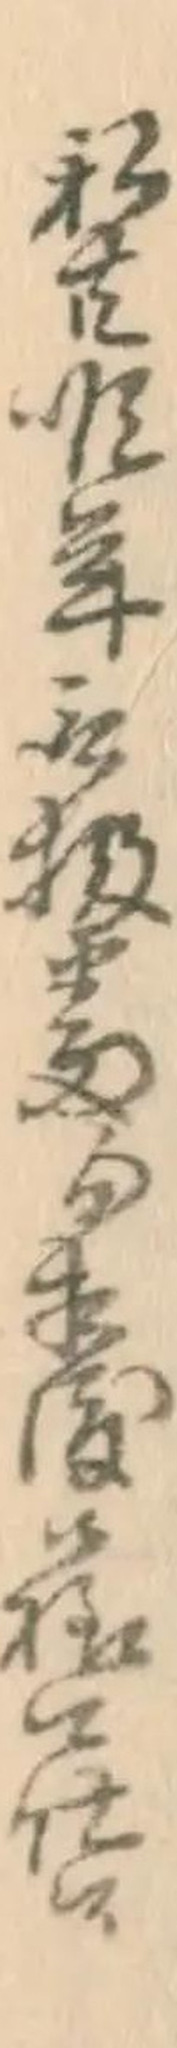私共昨年取扱番ゟ相渡候様可仕候
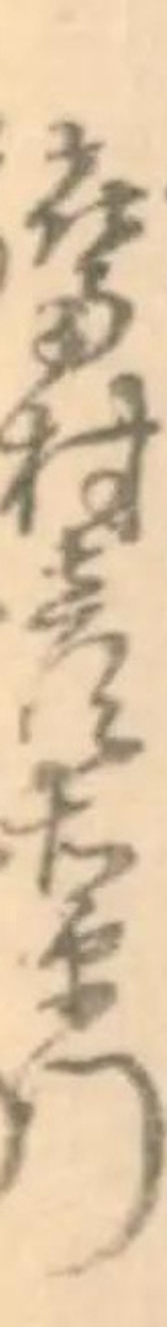喜多村彦右衛門
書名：三橋 17巻. [7] 三橋小破御修復書留　但御奉行御掛リ替地震潰橋番屋　嘉永四亥年より安政二卯年迄　上
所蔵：国立国会図書館 National Diet Library, JAPAN
